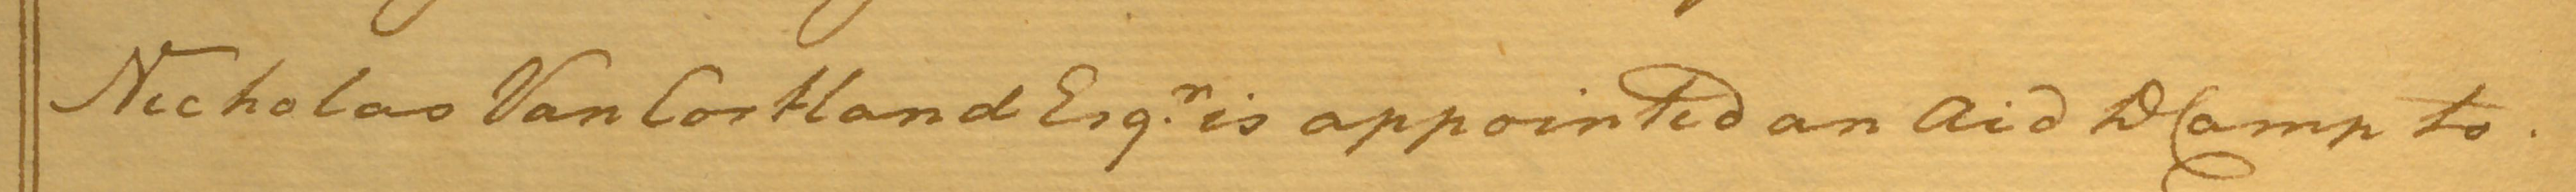Nicholas Van Cortland Esq^r. is appointed an Aid D Camp to
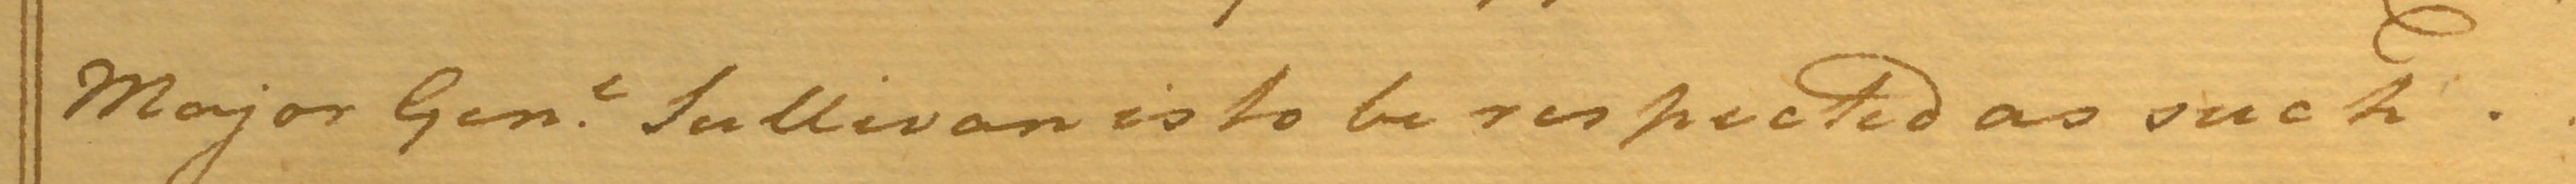Major Gen^l. Sullivan is to be respected as such.
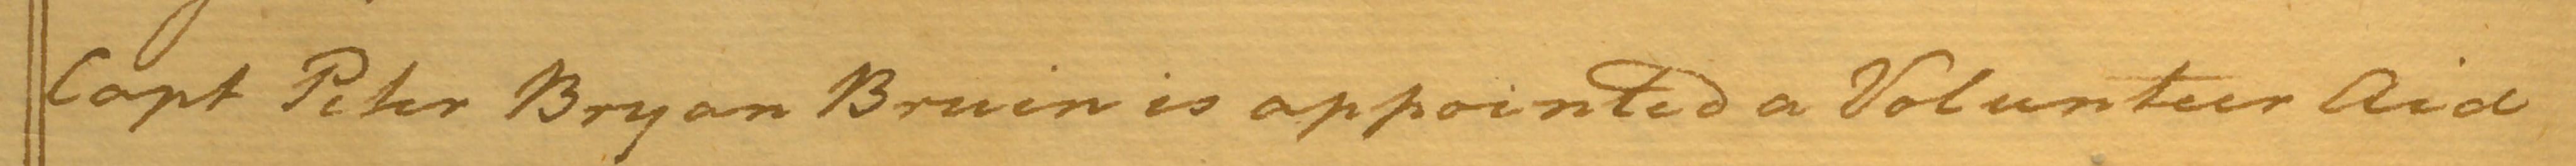Capt Peter Bryan Bruin is appointed a Volunteer Aid
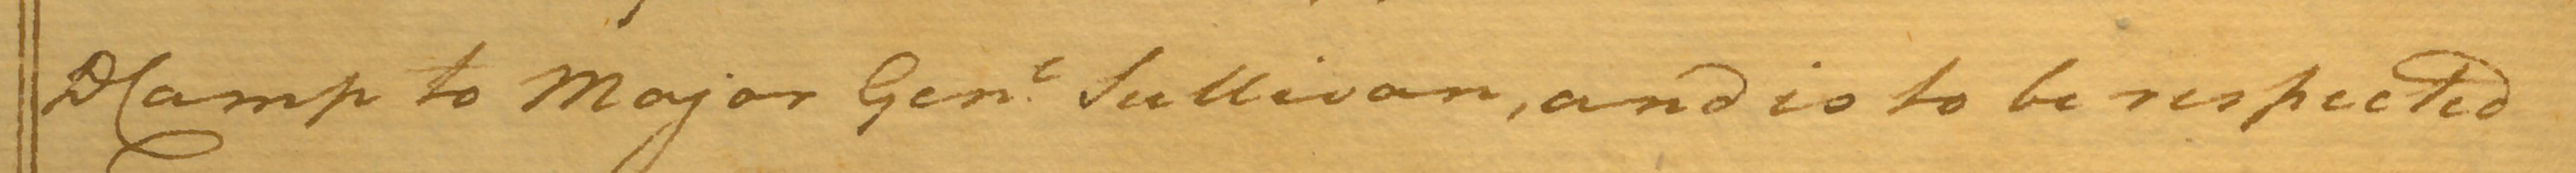D Camp to Major Gen^l. Sullivan, and is to be respected
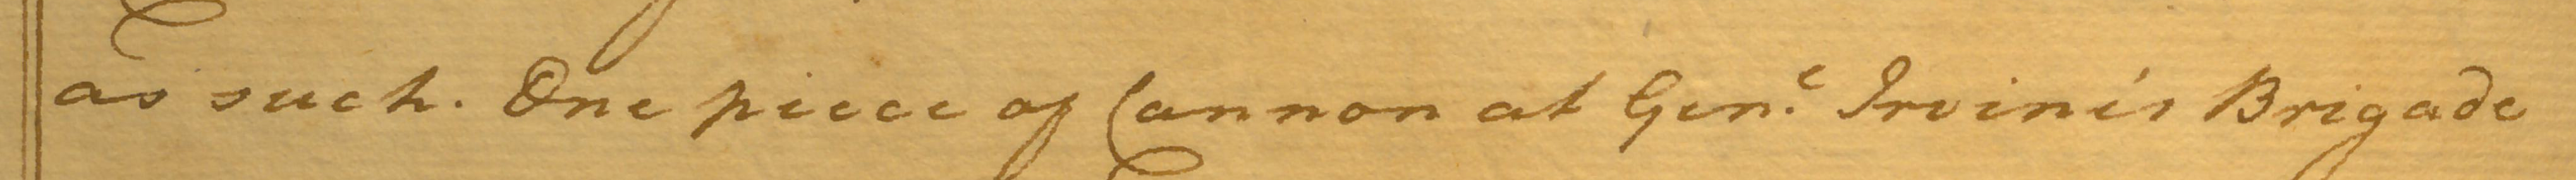as such. One piece of Cannon at Gen^l. Irvine's Brigade
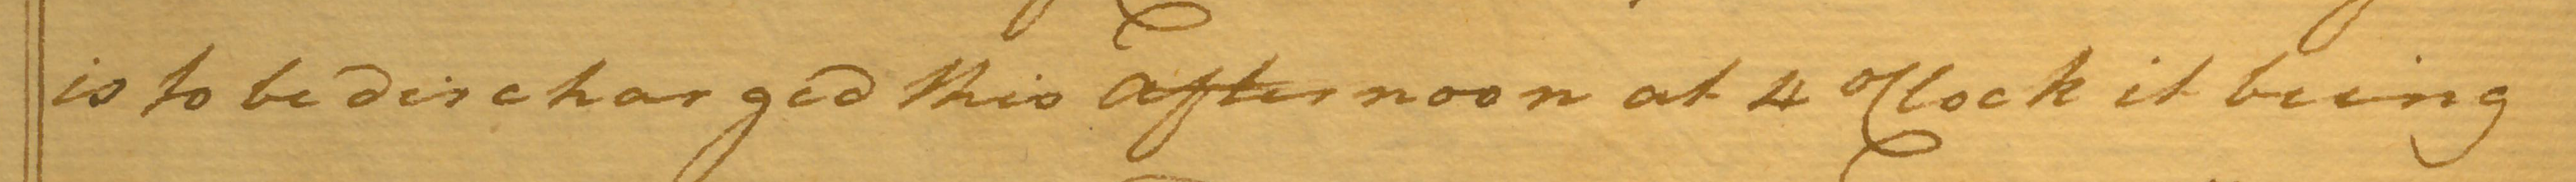is to be discharged this Afternoon at 4 ^oClock it being
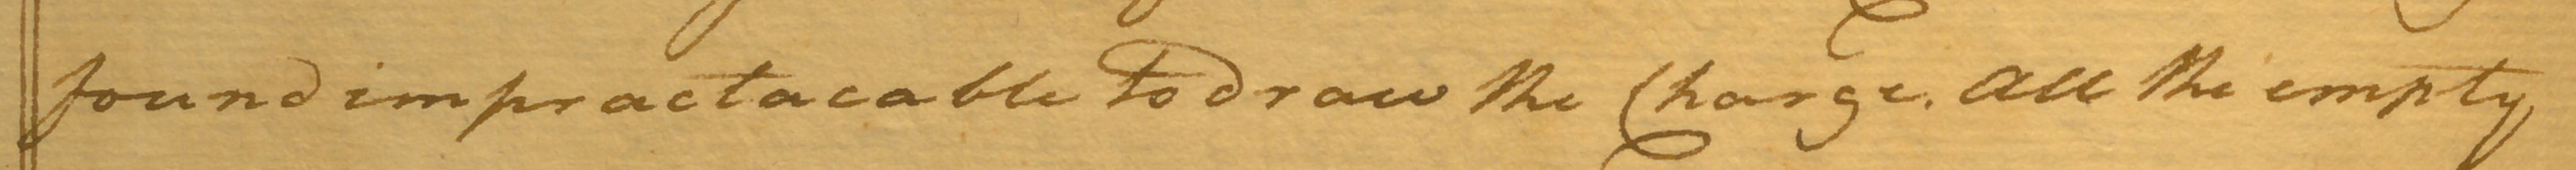found impractacable to draw the Charge. All the empty
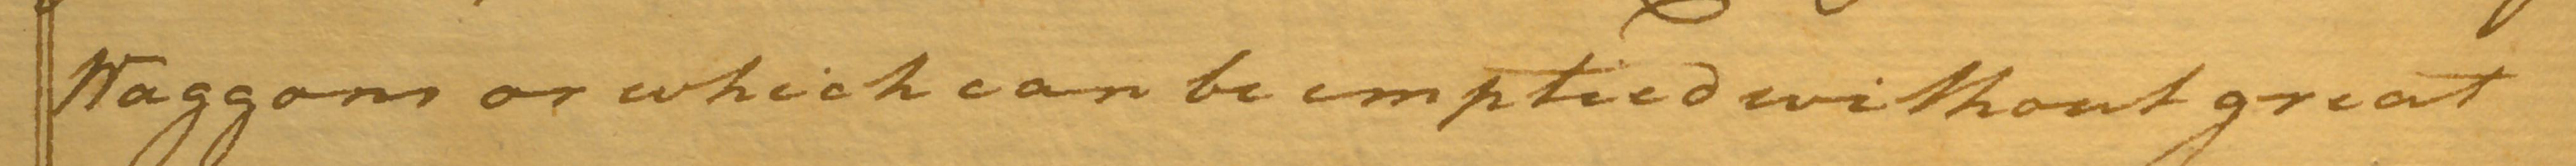Waggons or which can be emptied without great
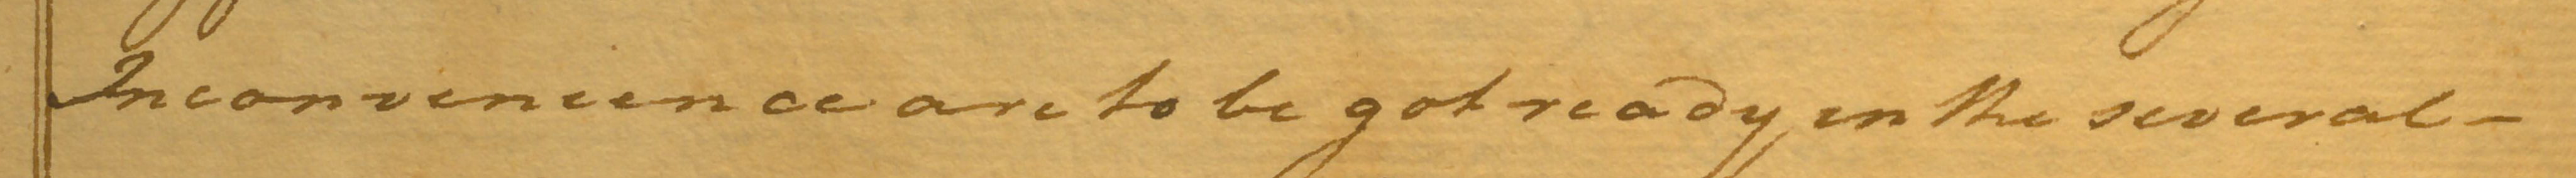Inconvenience are to be got ready in the several-
